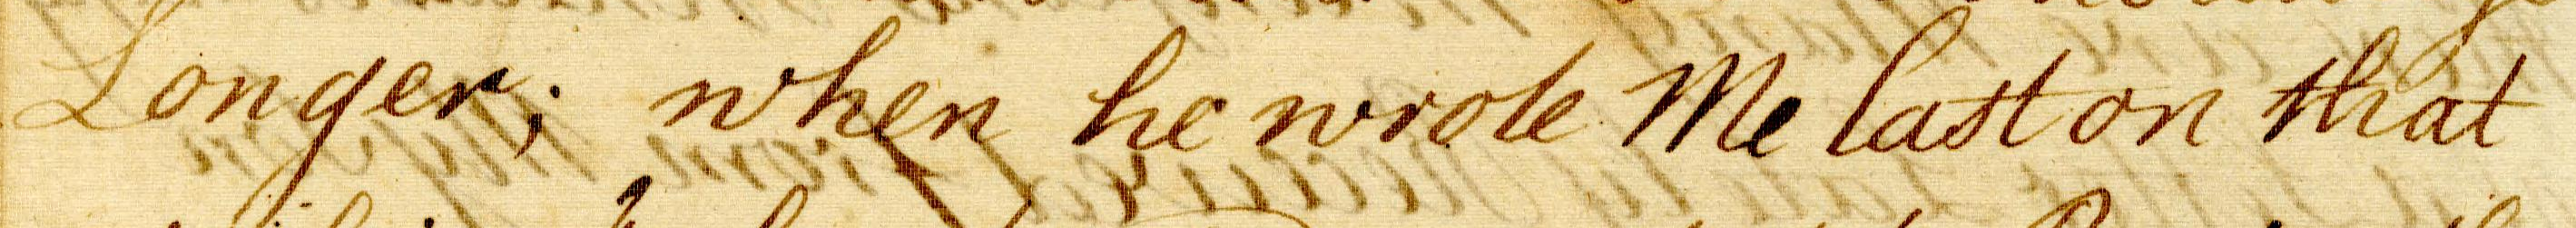Longer; when he wrote Me last on that
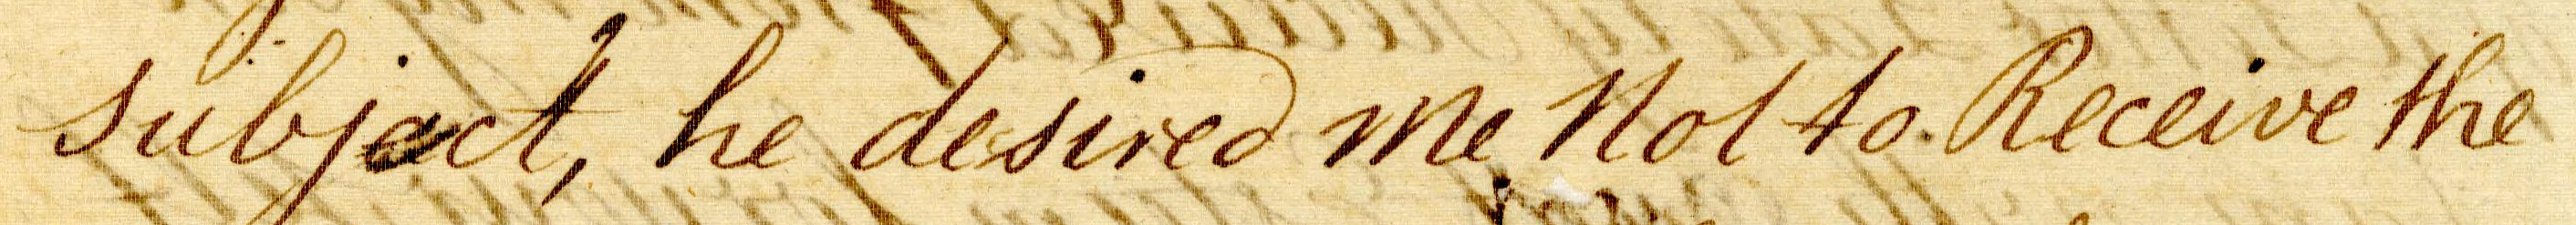subject, he desired Me Not to Receive the
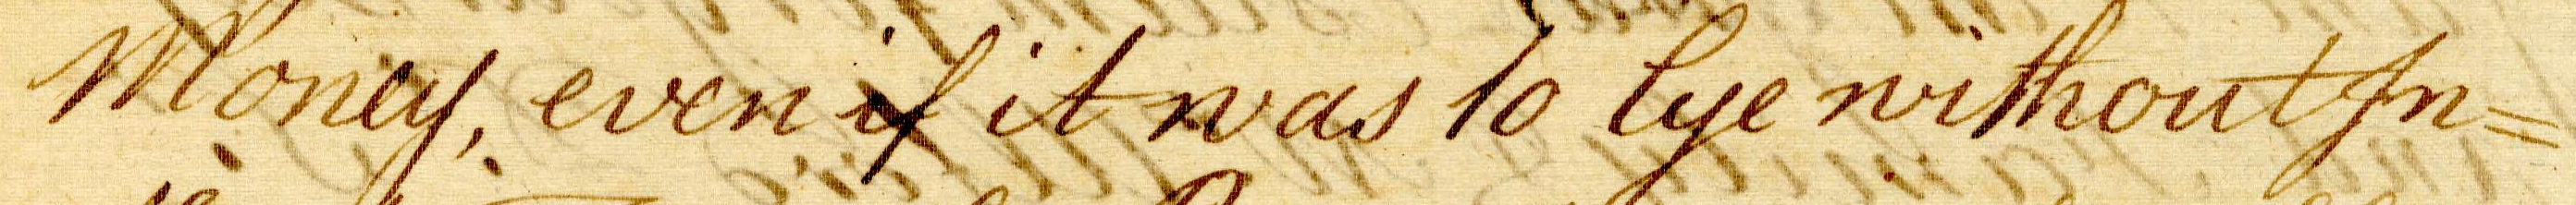Money, even if it was to lye without In
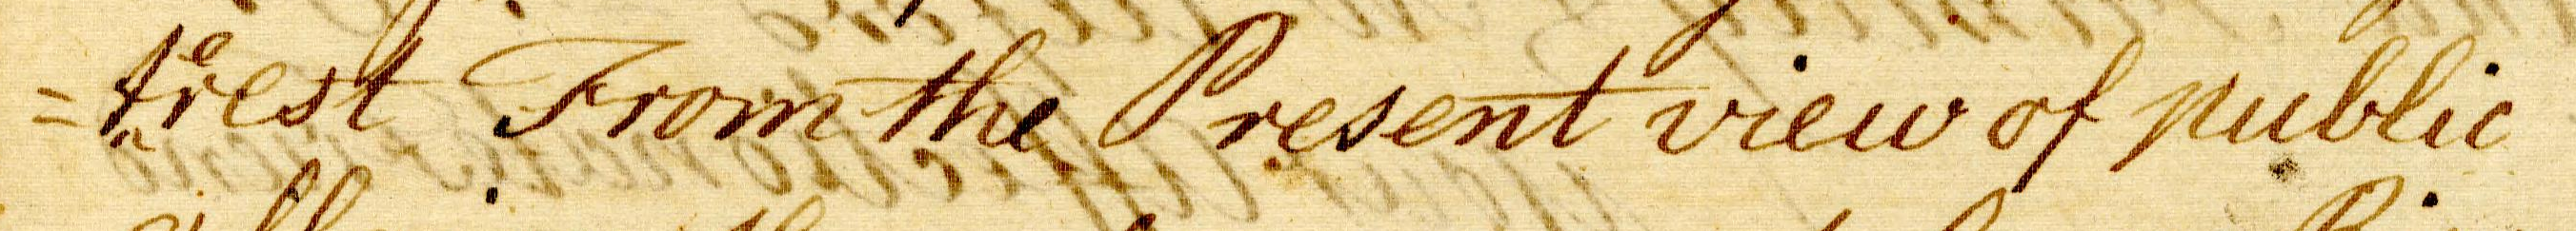t^erest From the Present view of public
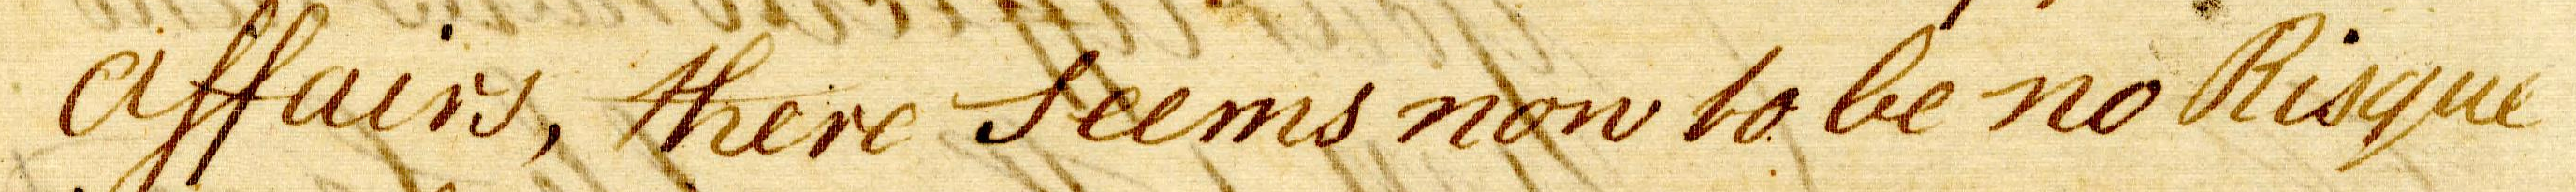Affairs, there seems now to be no Risque
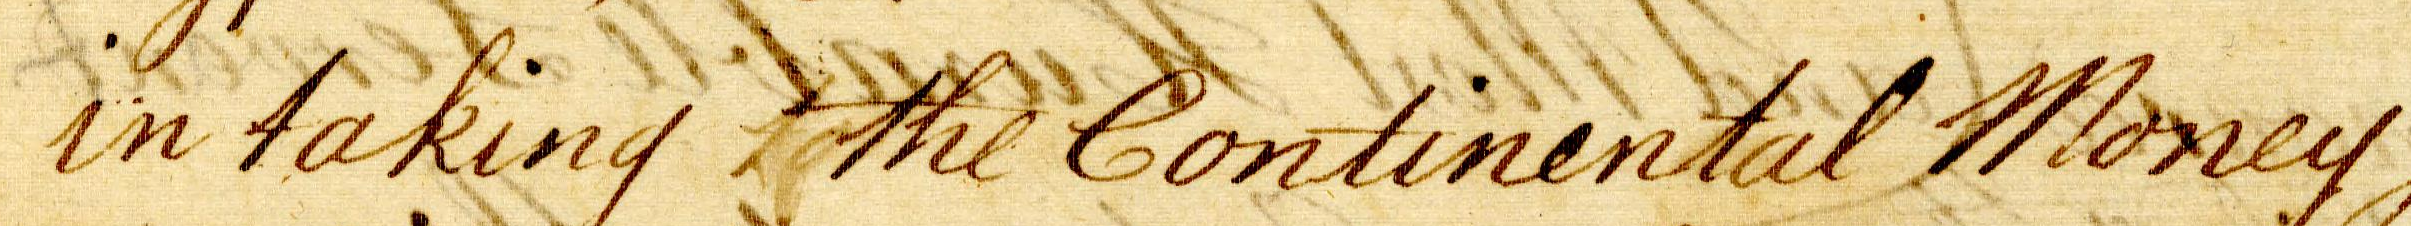in taking the Continental Money
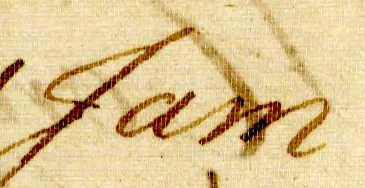I am
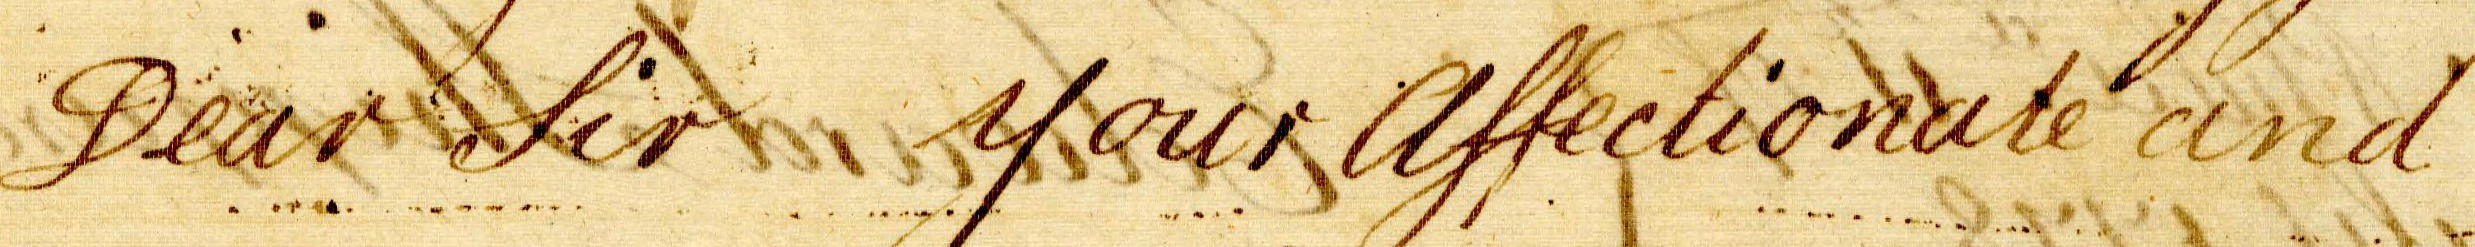Dear Sir Your Affectionate and
